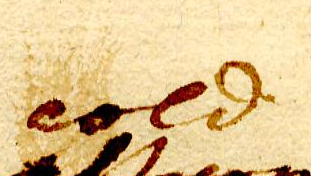cold
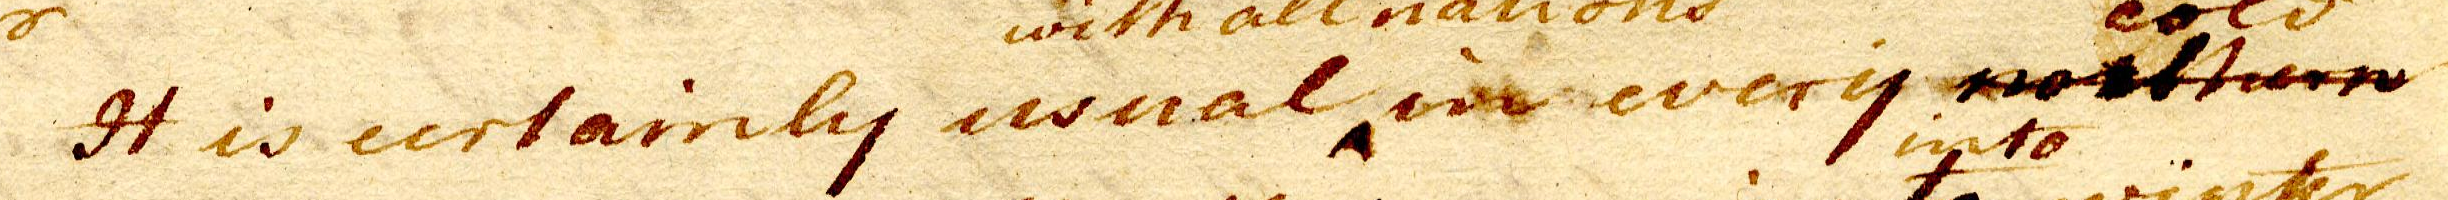It is certainly usual & in every [northern]
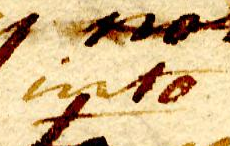into
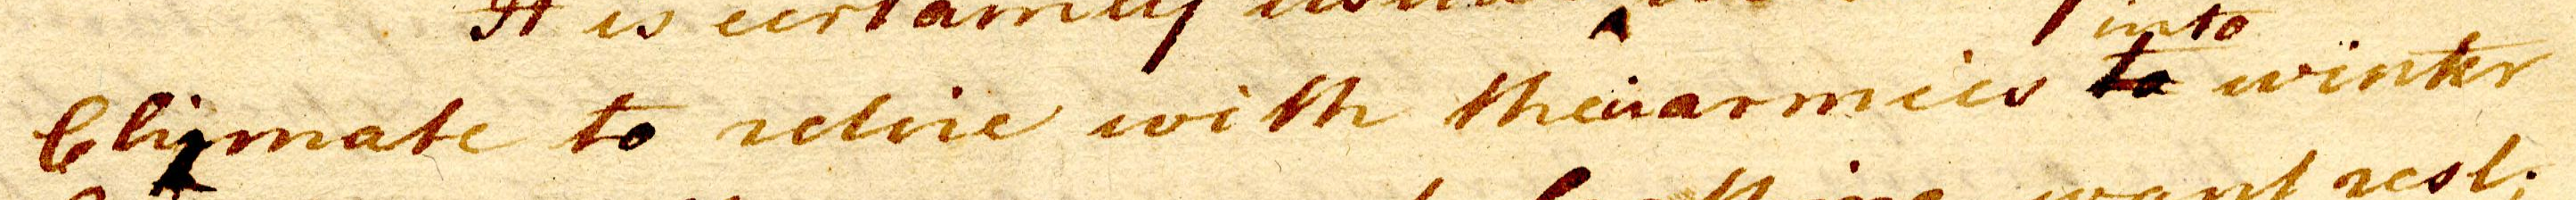Climate to retire with their armies [to] winter
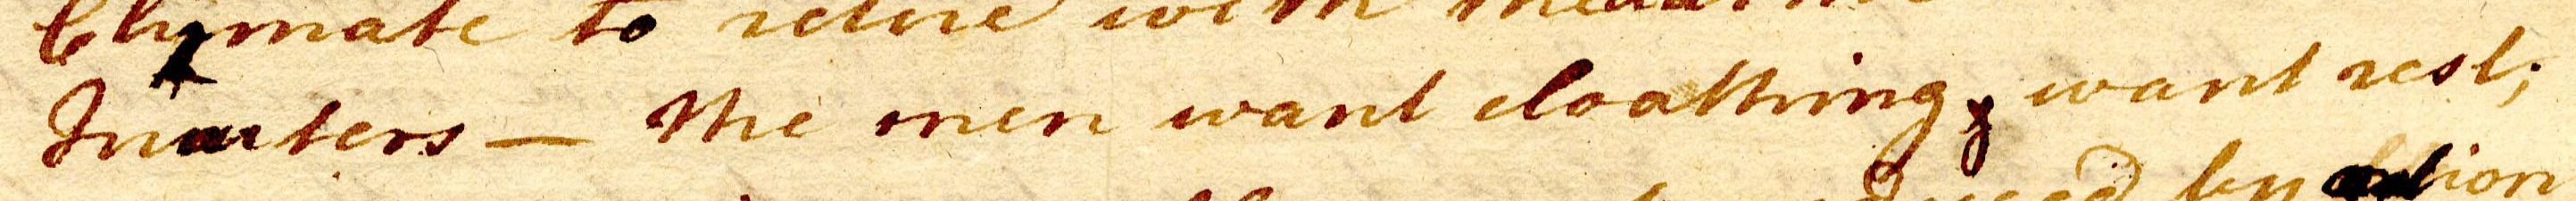Quarters- The men want cloathing, want rest;
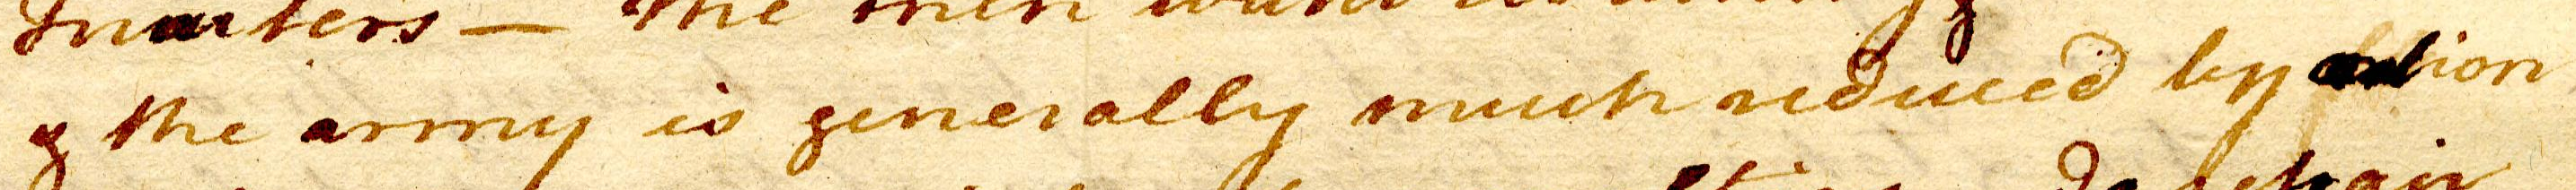& the army is generally much reduced by [___]ion
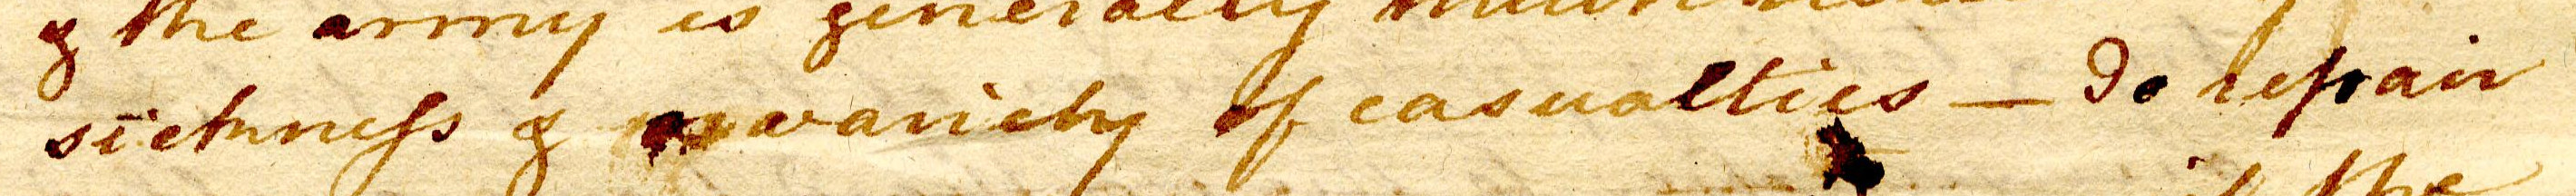sickness & a variety of casualties- To refrain
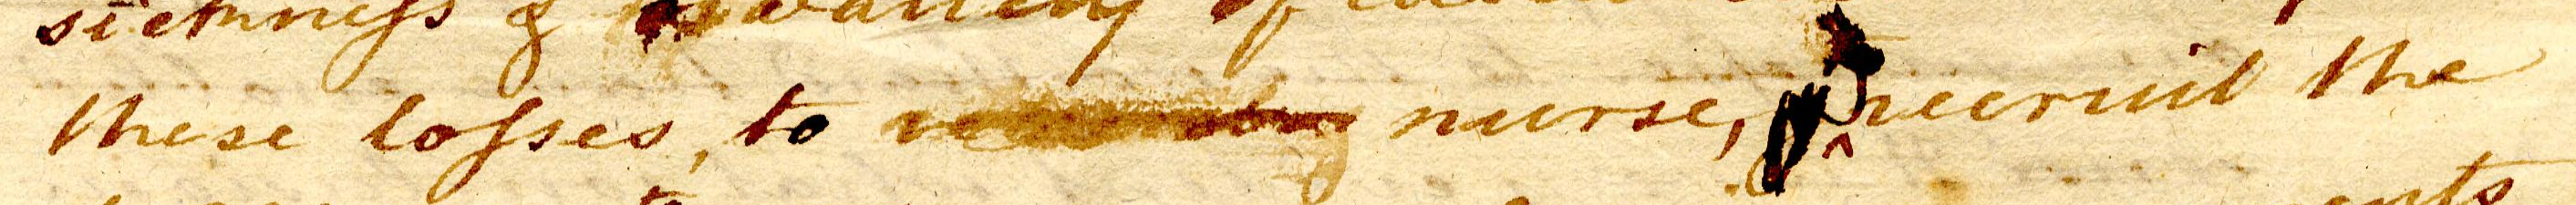these losses to [_____] nurse, [__] recruit the
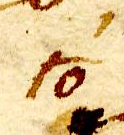to
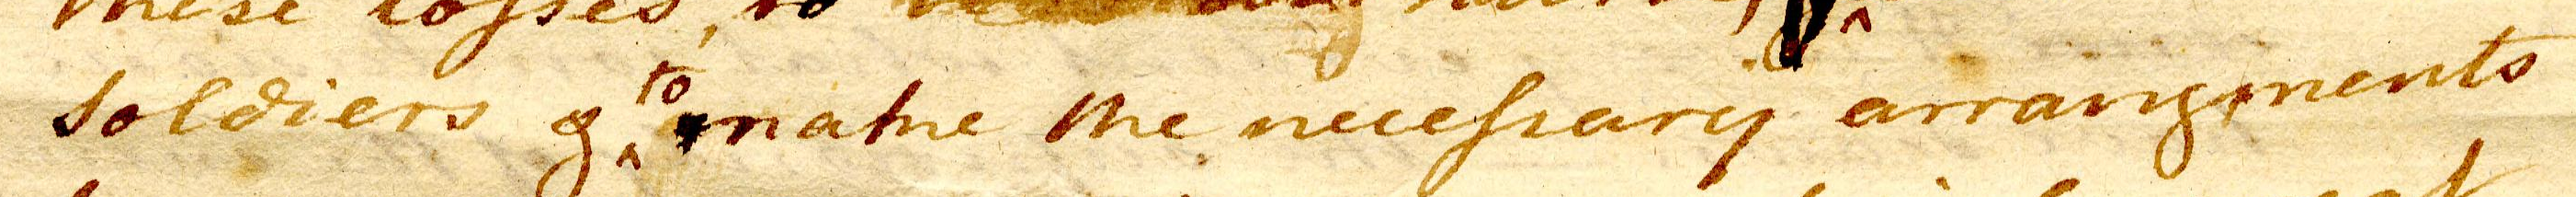soldiers & make the necessary arrangments
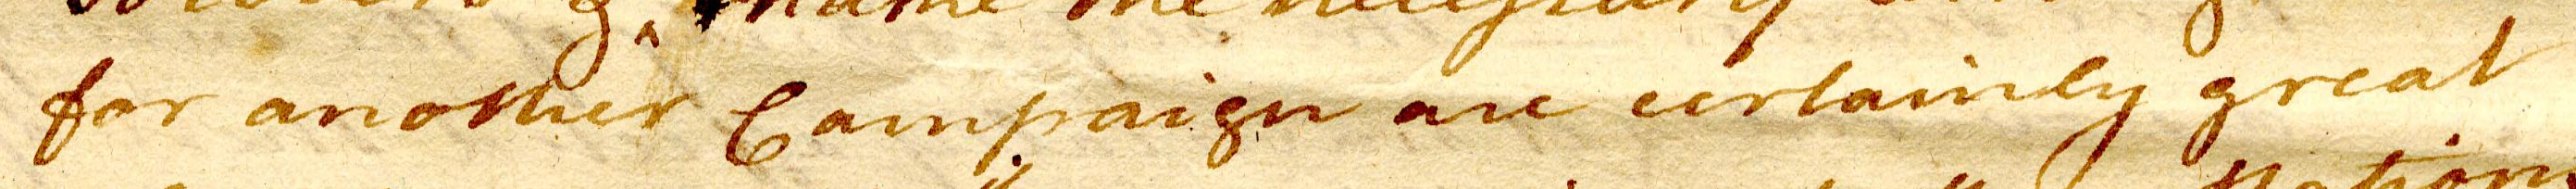for another Campaign are certainly great
